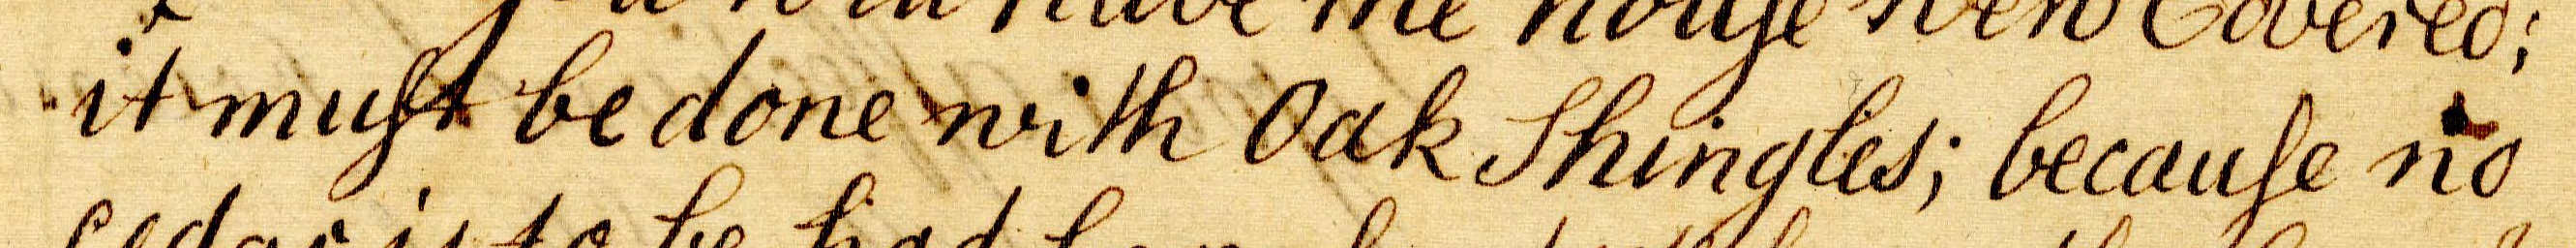it must be done with Oak Shingles; because no
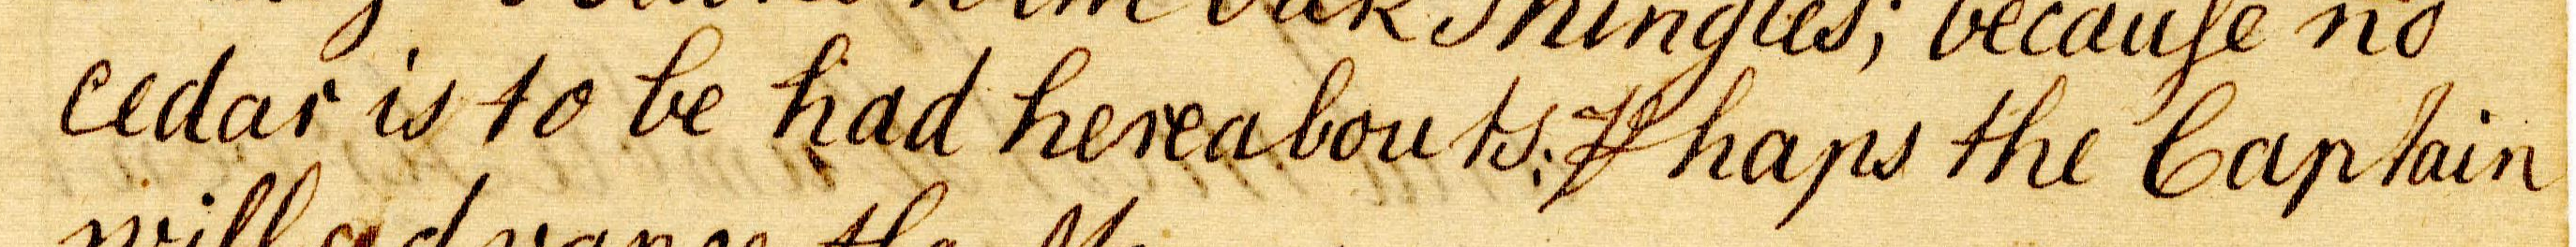cedar is to be had hereabouts: per haps the Captain
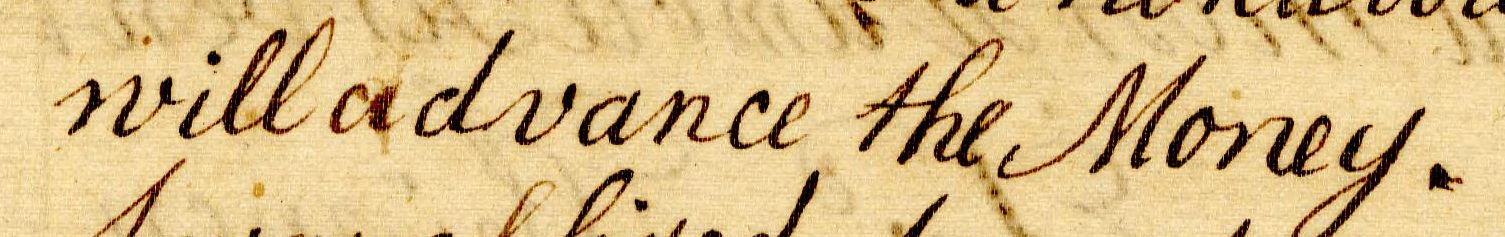will advance the Money.
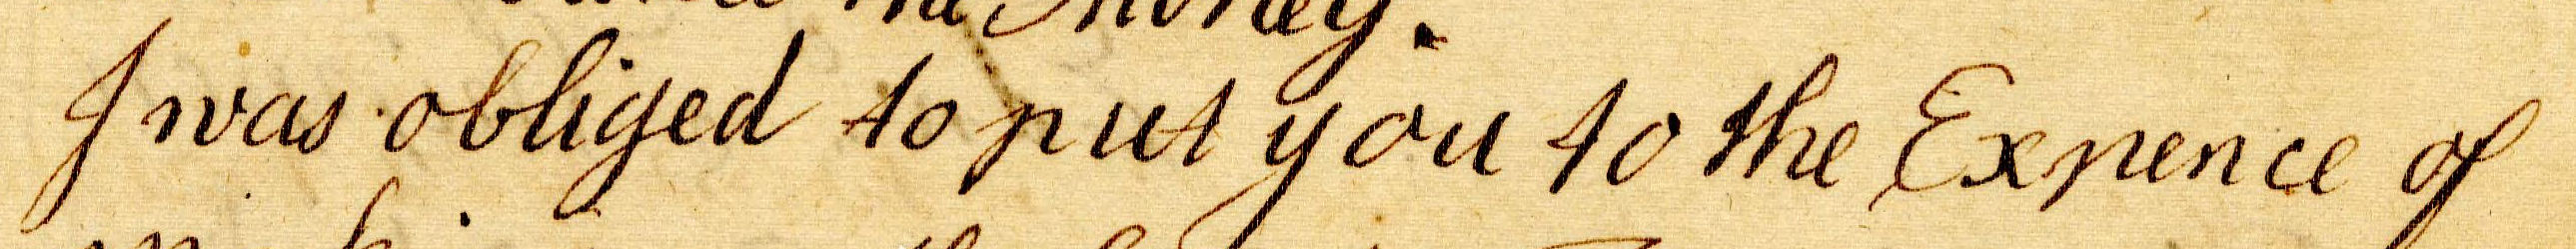I was obliged to put you to the Expence of
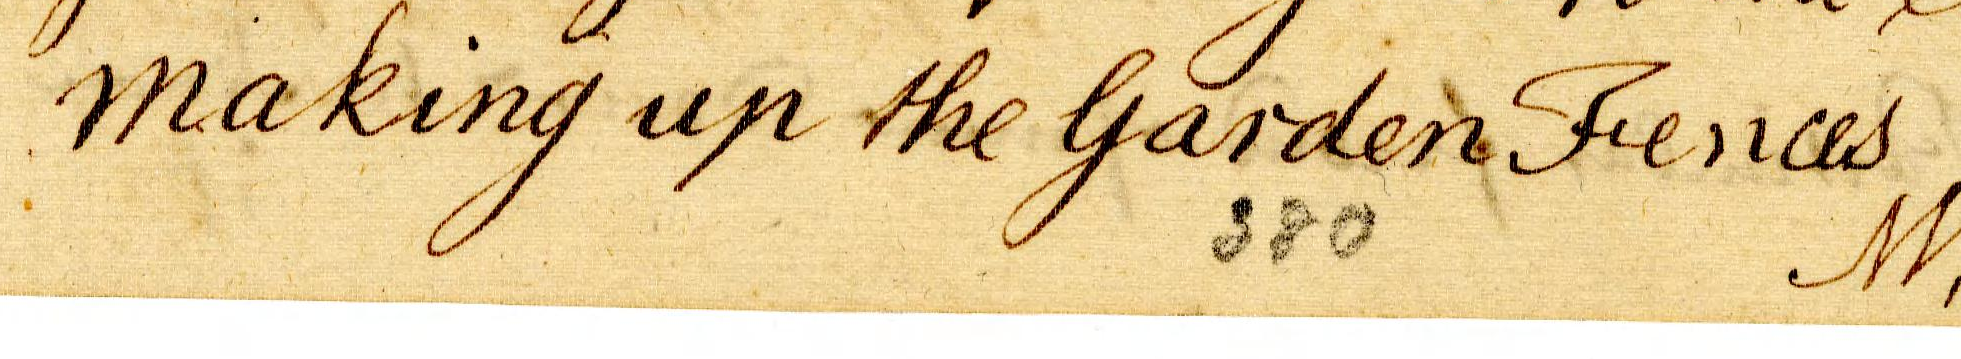Making up the Garden Fences
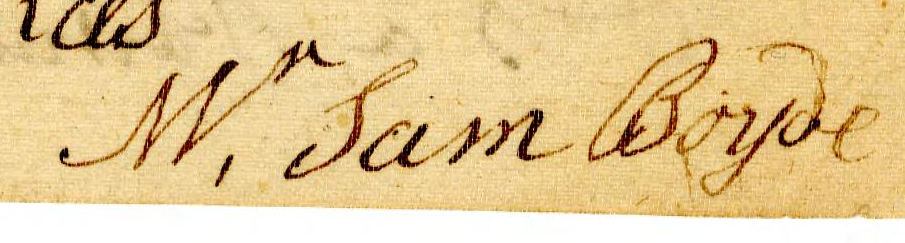M^r. Sam Boyde
